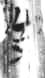{尸拃}（作）
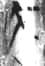大
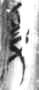事
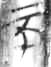不
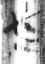必
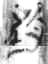毀
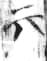亓（其）
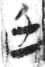王
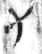又（有）
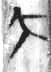大
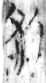咎
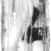亓（其）
